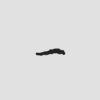一
